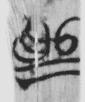爲
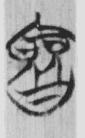噞
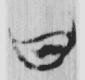甘
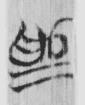爲
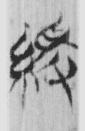緩
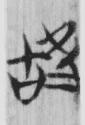{古欠}
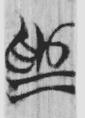爲
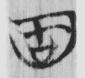固
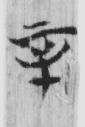辛
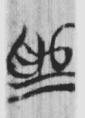爲
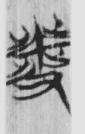{歮十廾}
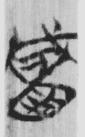鹹
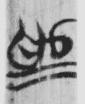爲
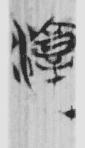淳
